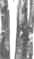乙
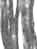丙
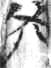癸
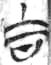吉
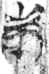庚
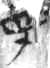辛
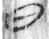日
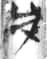凡
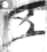五
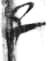子
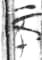不
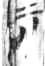可
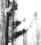㠯（以）
